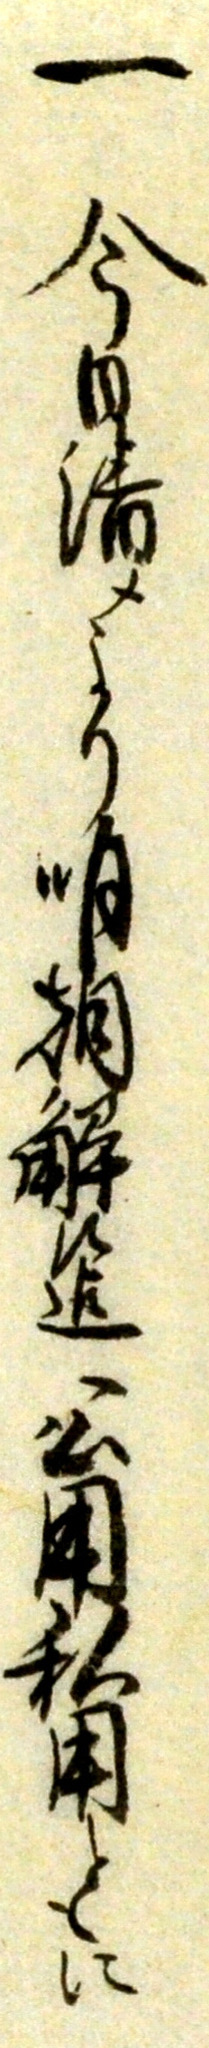一今日清メより明朝解候迠公用私用ともに
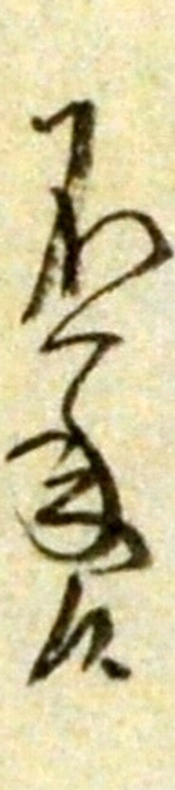不参候
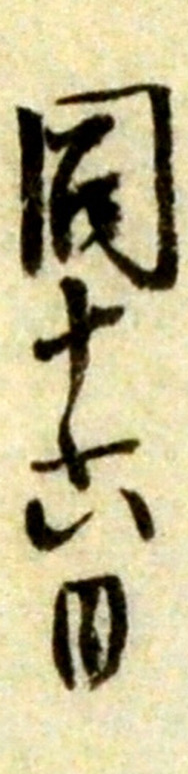同十六日
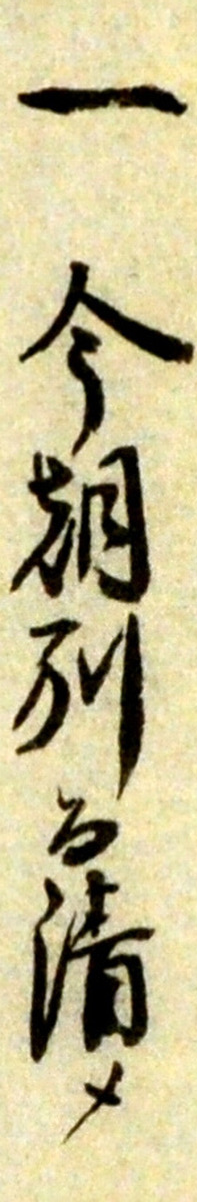一今朝別而清メ
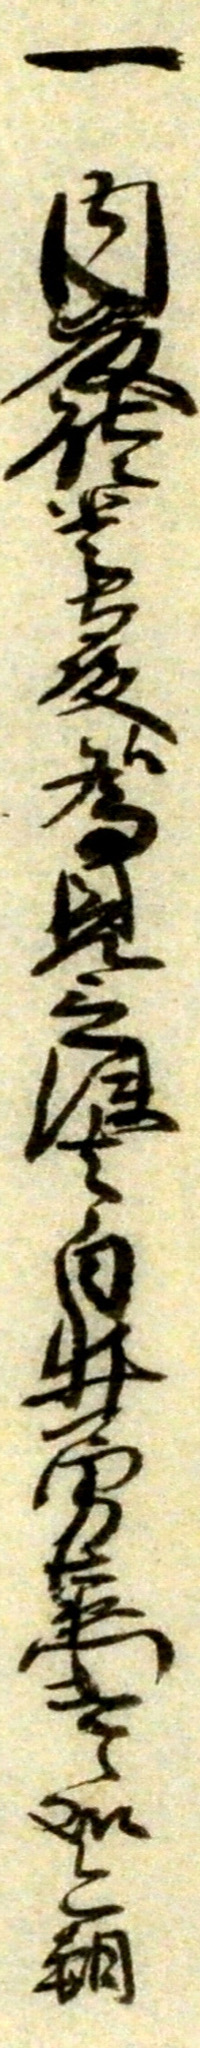一内藤能登守殿江為見立使者白井勇左衛門遣之処今朝
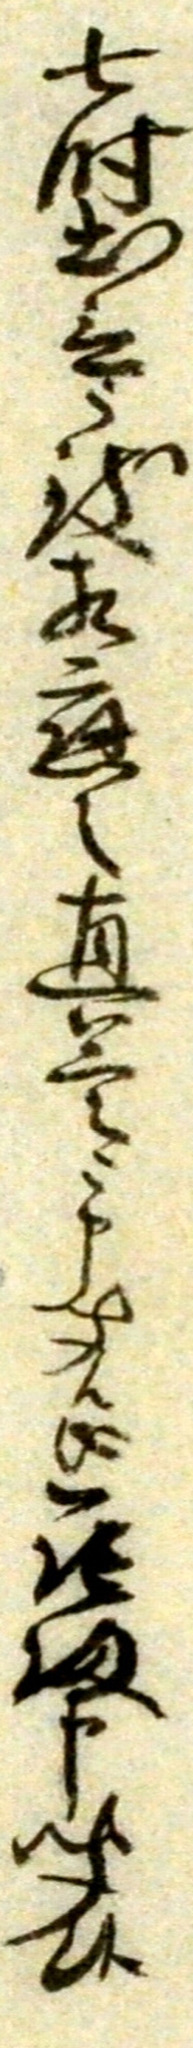七時出立被致相応之直答被申聞候由罷帰申聞候
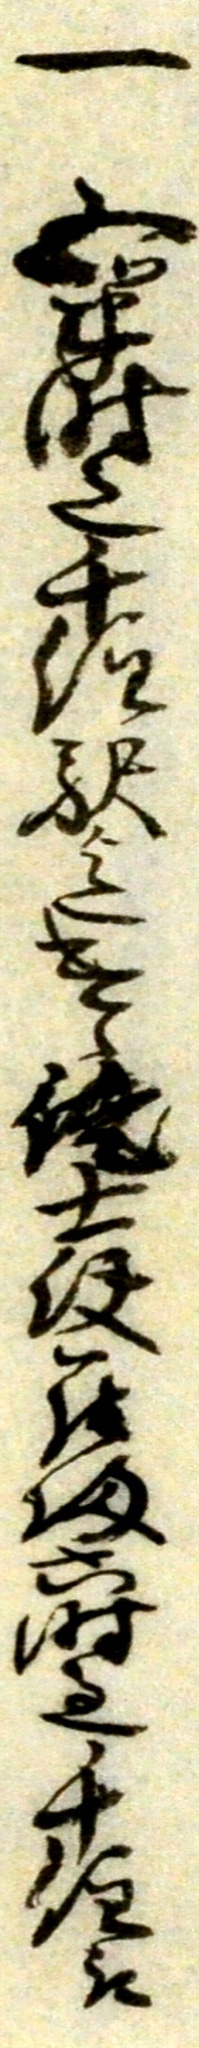一五半時過千住駅迄遣候徒士使罷帰六時過千住被
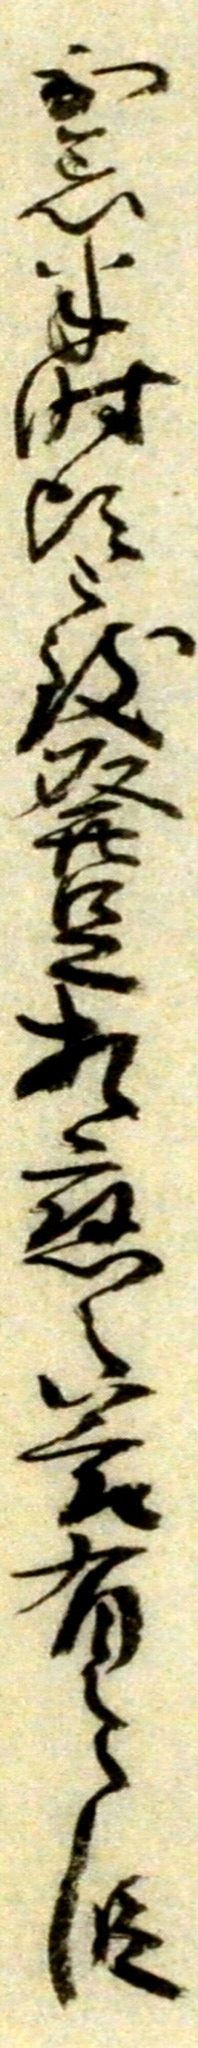到着半時頃被致発足相応之答有之候段
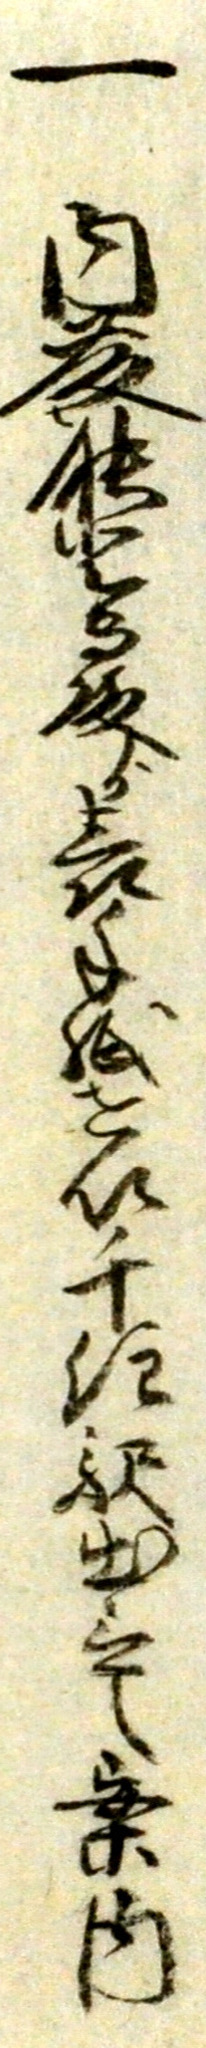一内藤能登守殿ゟ表手紙を以千住駅出有之案内
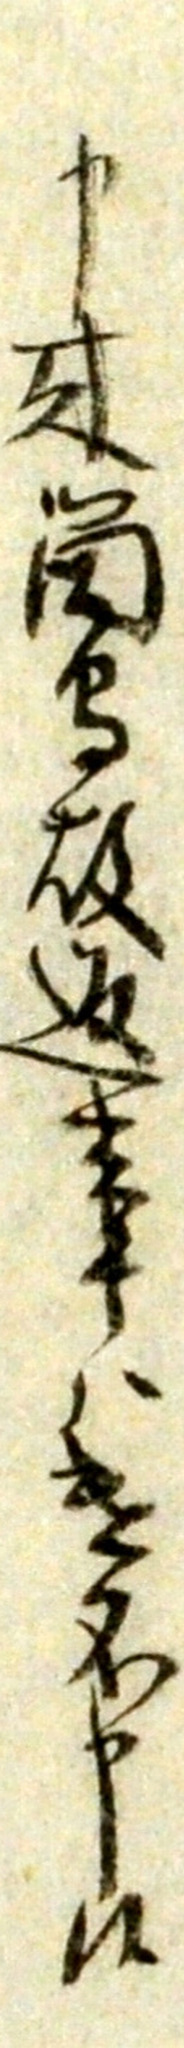申来留守故返事ハ遣不申候
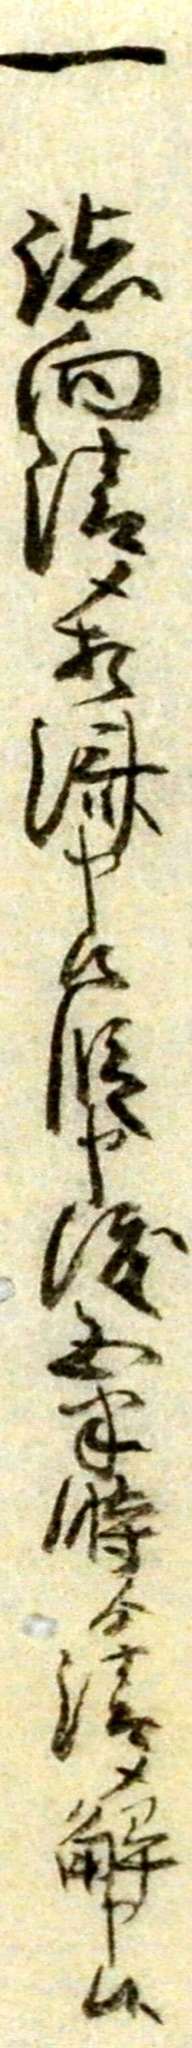一諸向清メ相済申候段申渡五半時ゟ清メ解申候
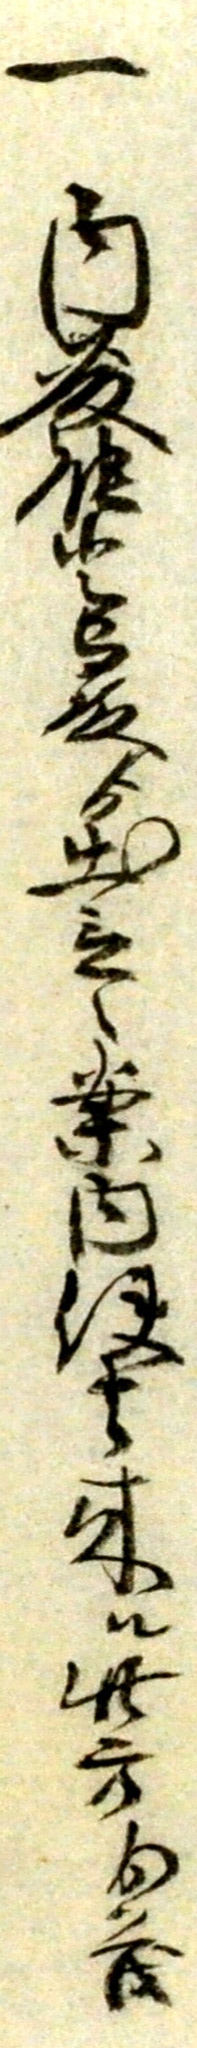一内藤能登守殿ゟ出立之案内使者来ル此方ゟ茂
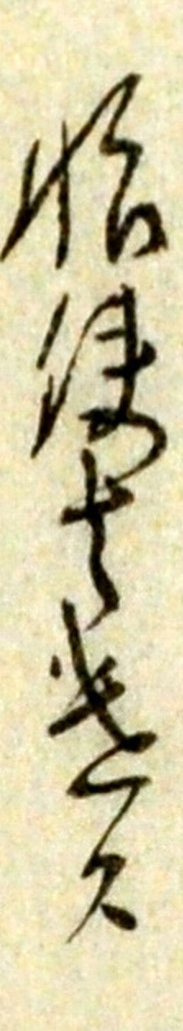脇使申遣ス
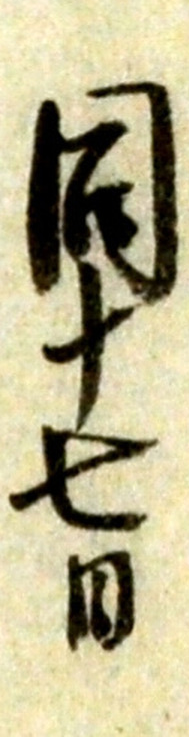同十七日
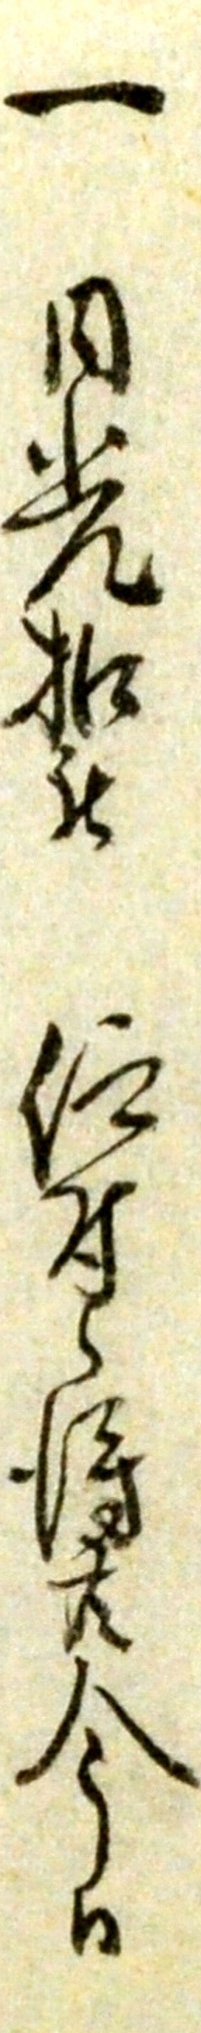一日光扣被仰付候得共今日

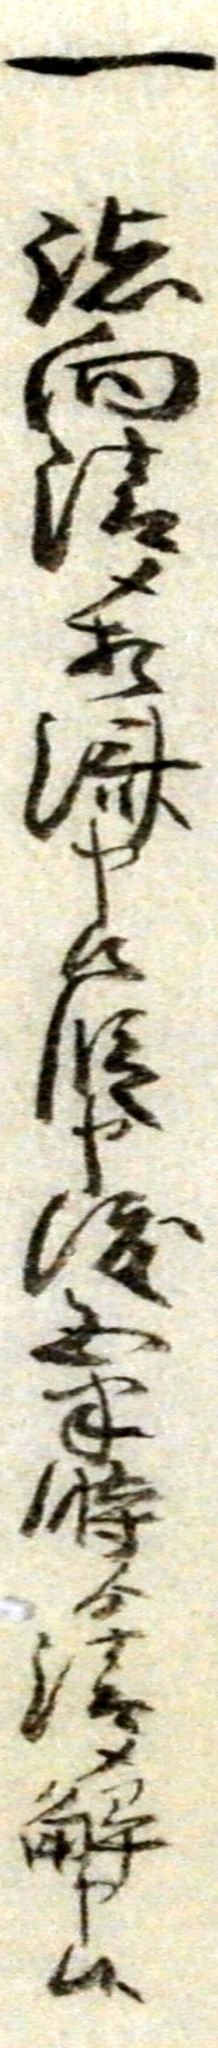一諸向清メ相済申候段申渡五半時ゟ清メ解申候
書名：日光御名代相勤候節ノ留
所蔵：伊那市立高遠町図書館・合同会社AMANE
